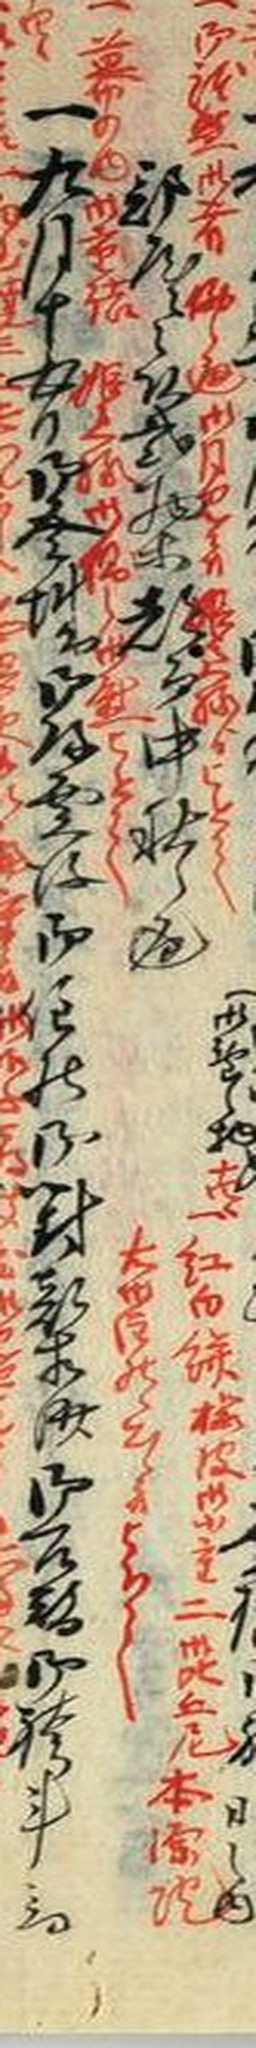一九月十五日御登城御帰殿後御住居御対顔相済御召替御袴斗ニ而
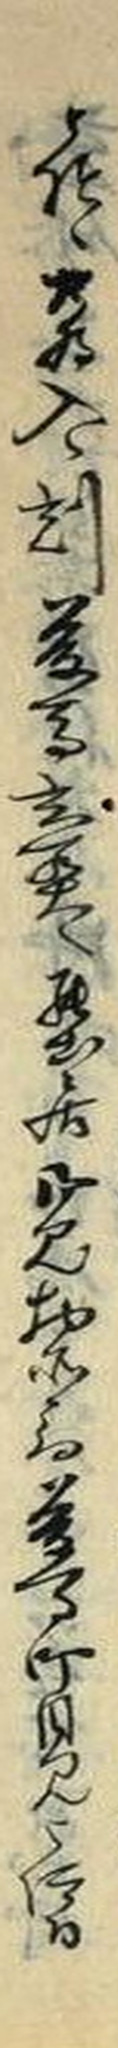被遊候被為入候刻藤馬玄関へ罷出居御見物所ニ而藤馬御目見被仰付

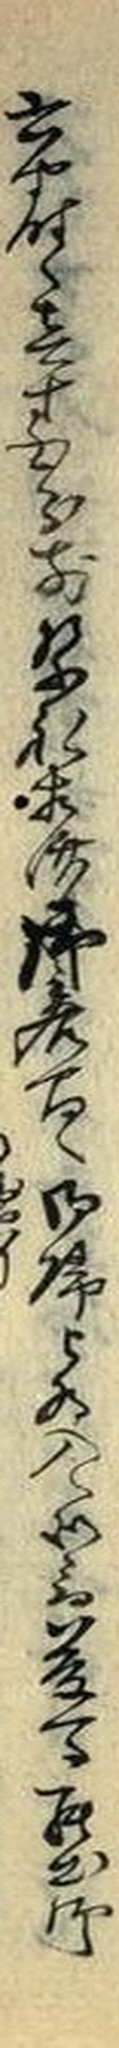六半時へ壱寸五分前祭礼相済御居間へ御帰被為入候処ニ而藤馬罷出御
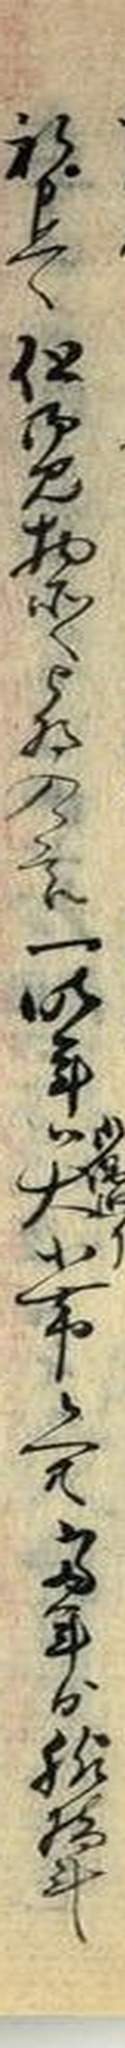礼申上候但御見物所へ被為入候節一昨年ハ御側廻り大小帯候へ共当年ゟ脇指斗
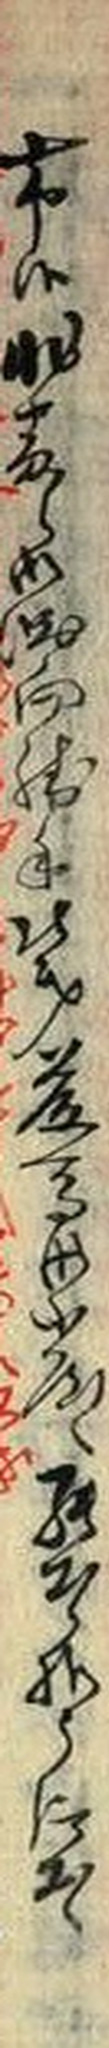帯候非番之御側向勝手次第藤馬御小屋へ罷出候様被仰出候
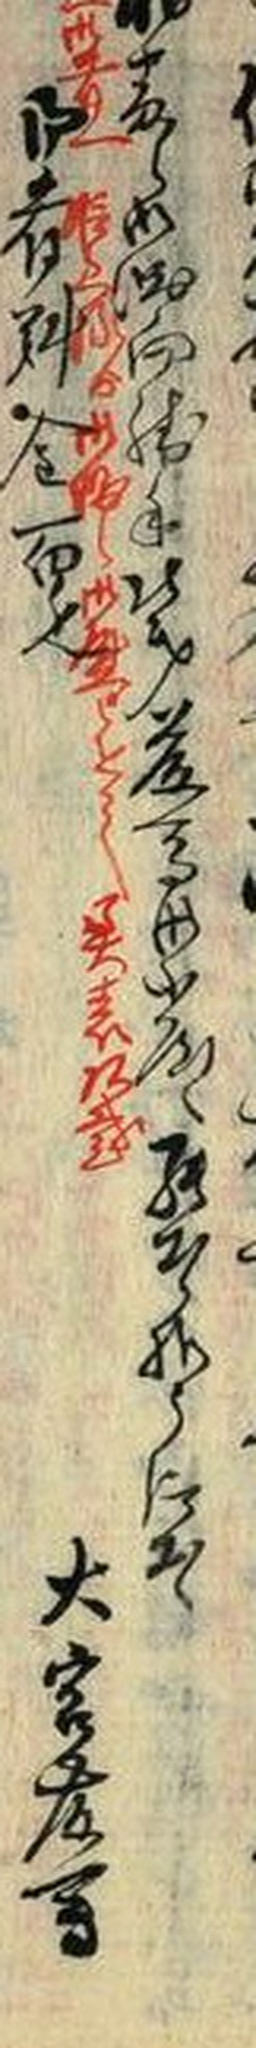御肴料金百疋大宮藤馬
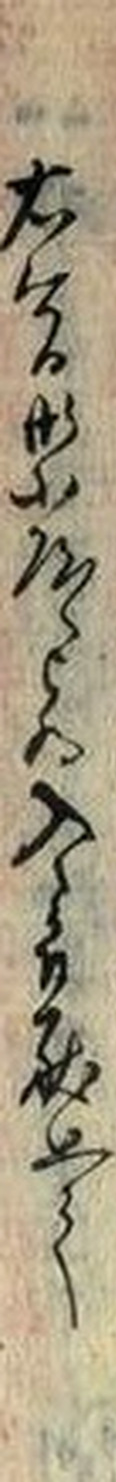右今日御小屋へ被為入候ニ付献上之
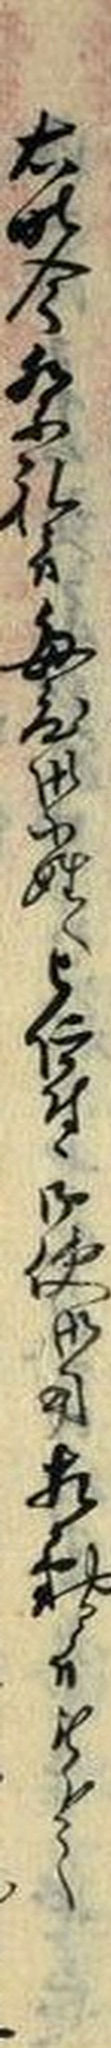右昨今祭礼ニ付毎度御小姓へ被仰付候御使御用相勤候ニ付被進之
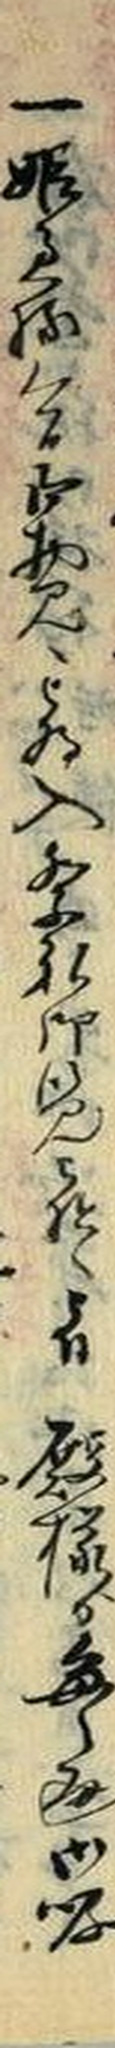一姫君様今日御物見へ被為入祭礼御覧被遊候ニ付殿様ゟ毎之通御吸
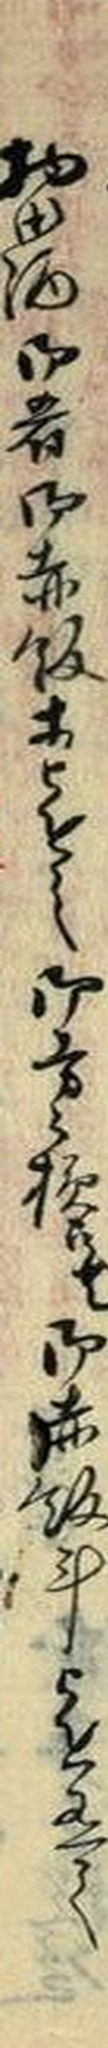物御酒御肴御赤飯等被進之御方々様江者御赤飯斗被進有之
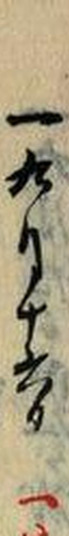一九月十六日
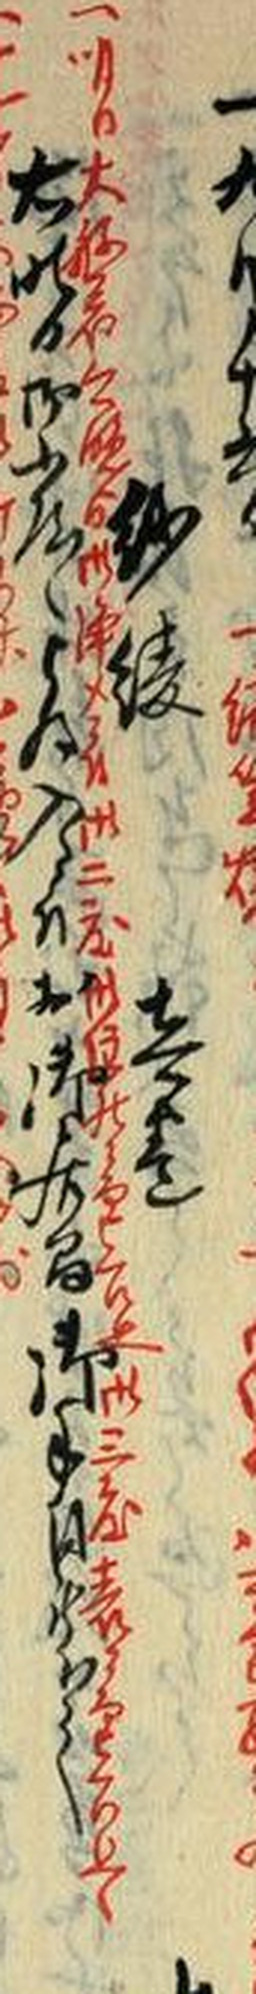右昨日御小屋へ被為入候ニ付於御居間御手自被下之
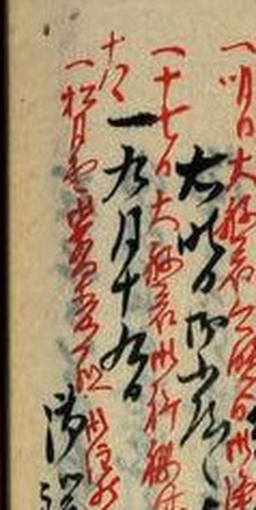一九月十九日
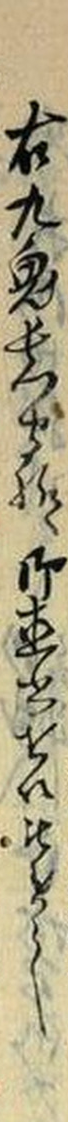右九鬼長門守様へ御直書を以被進之
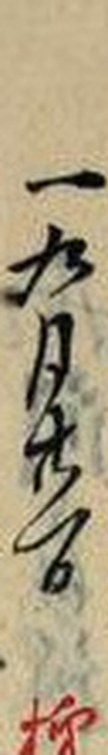一九月十六日
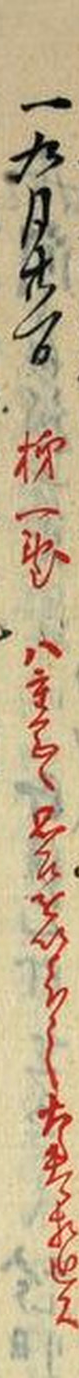一九月廿一日柿一台八重岡へ思召を以被下之大奥へ相廻ス
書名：少傅日録抄（斉承付側向頭取日記、在府）
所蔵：福井県文書館 Fukui Prefectural Archives
